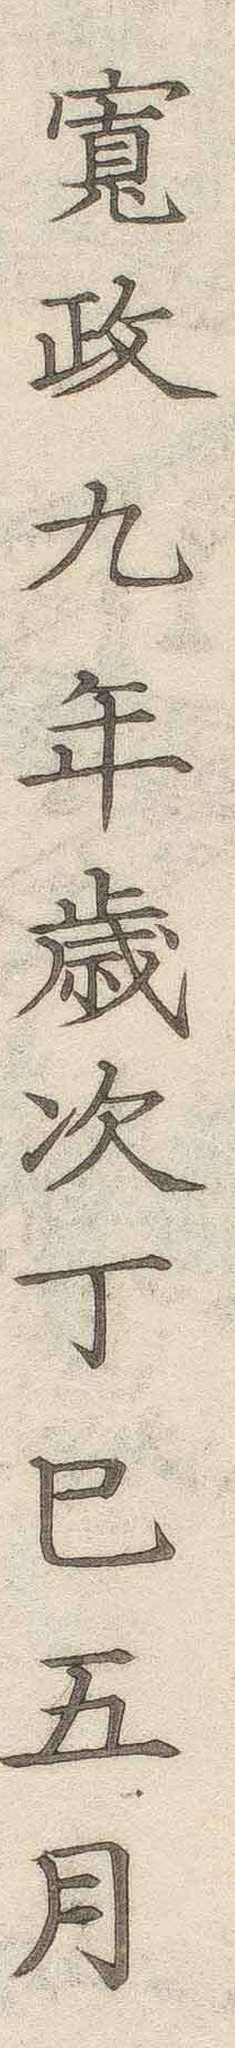寬政九年歳次丁巳五月
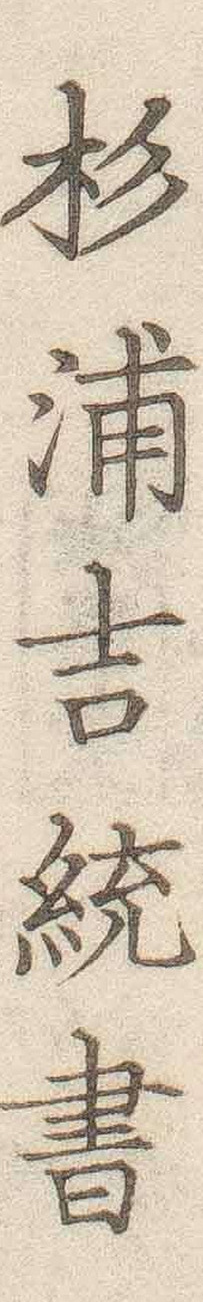杉浦吉統書
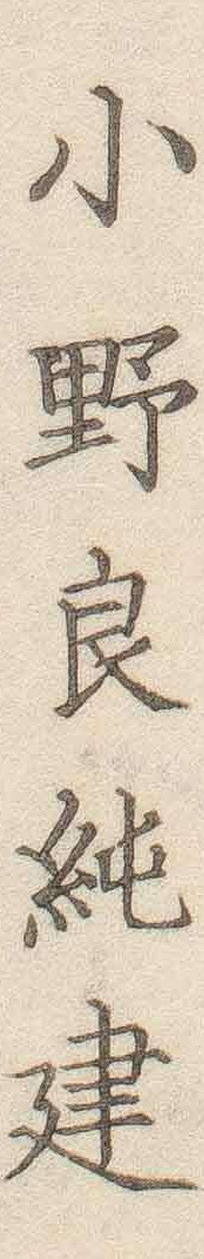小野良純建
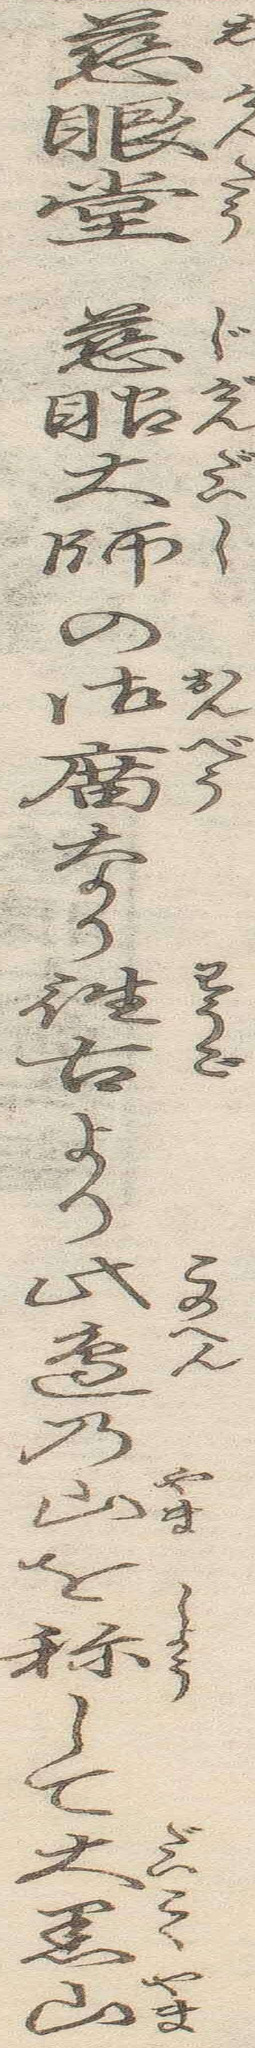慈眼堂慈眼大師の御庿なり徃古より此邊の山を称して大黒山
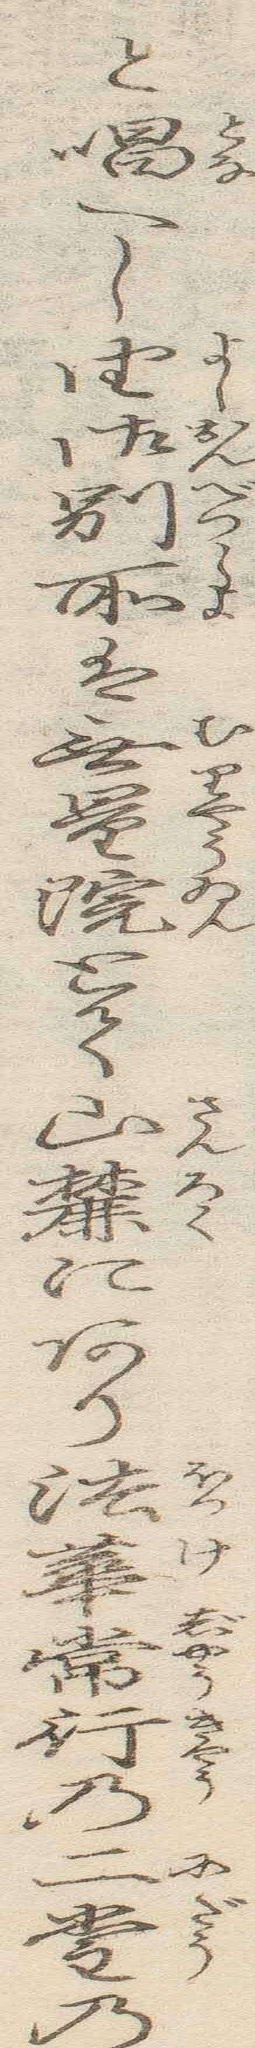と唱へし由御別所は無量院とて山麓にあり法華常行の二堂の
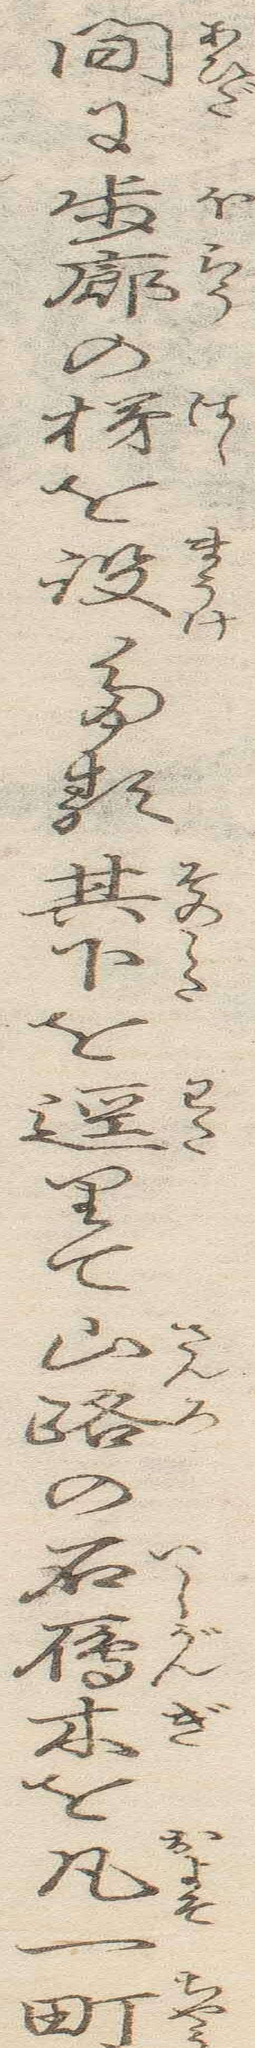間に歩廊の梯を設たる其下を逕りて山路の石雁木を凡一町
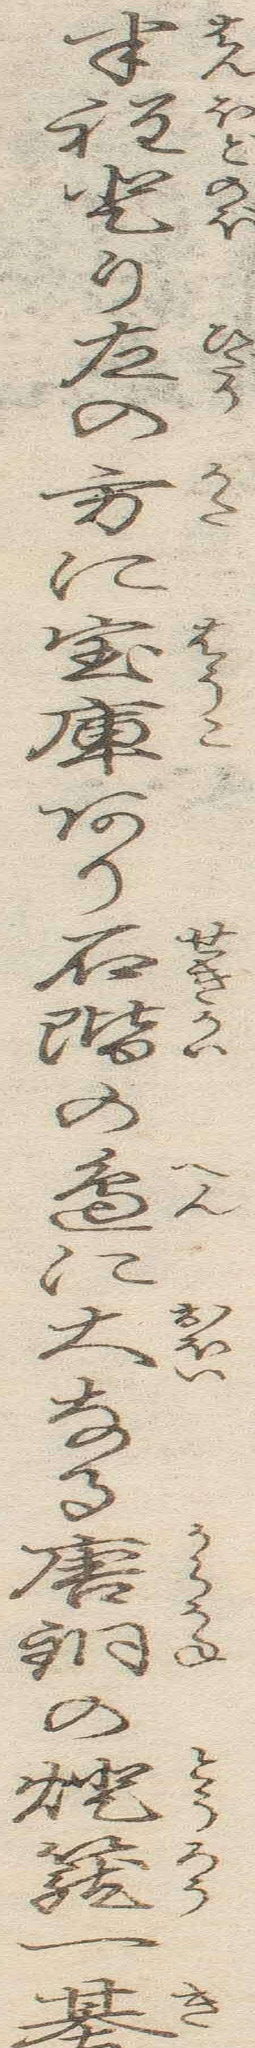半程登り左の方に宝庫あり石階の邊に大なる唐銅の燈籠一基
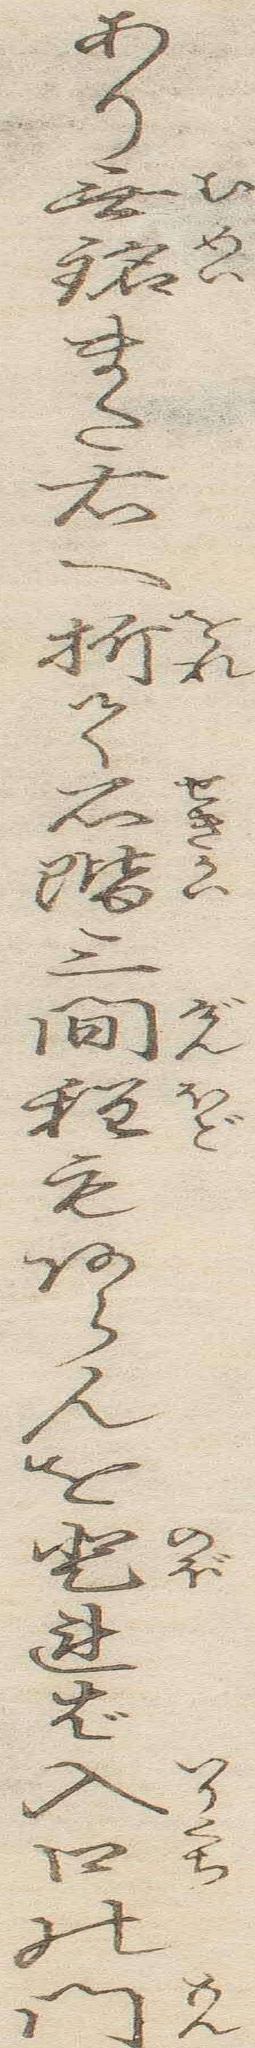あり無銘また右へ折て石階三間程もあらんを登れば入口の門
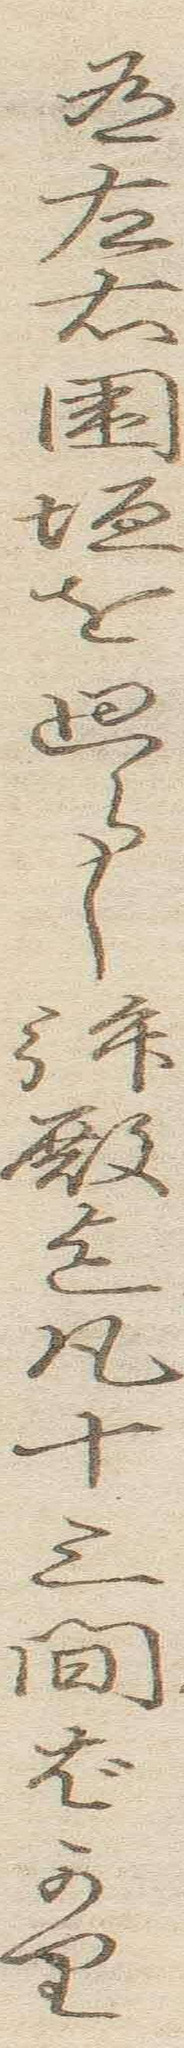有左右圍垣を廻らし拜殿迄凡十三間ばかり
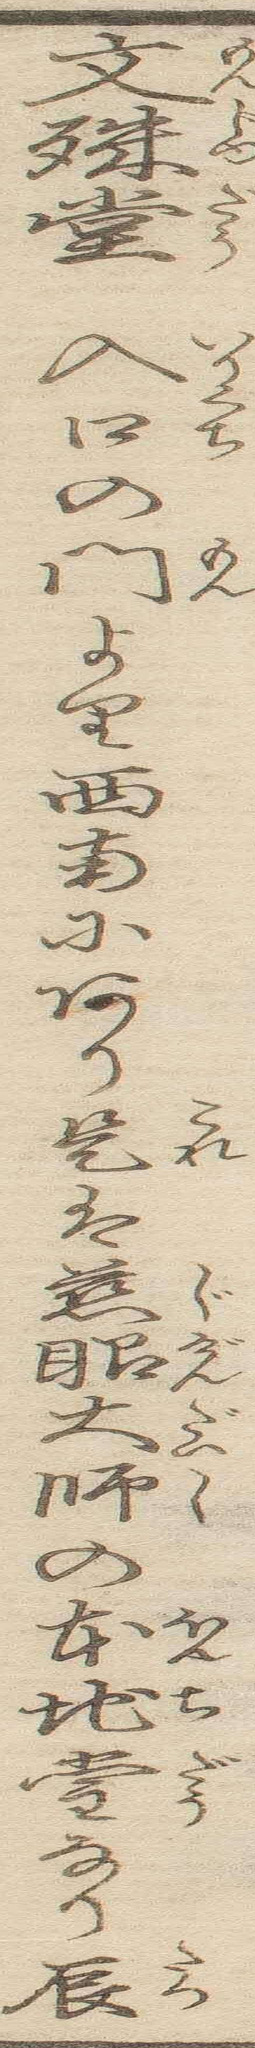文殊堂入口の門より西南にあり是は慈眼大師の本地堂なり辰

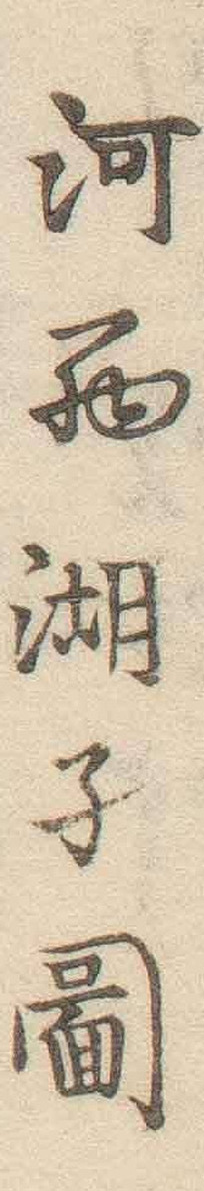河西湖子圖
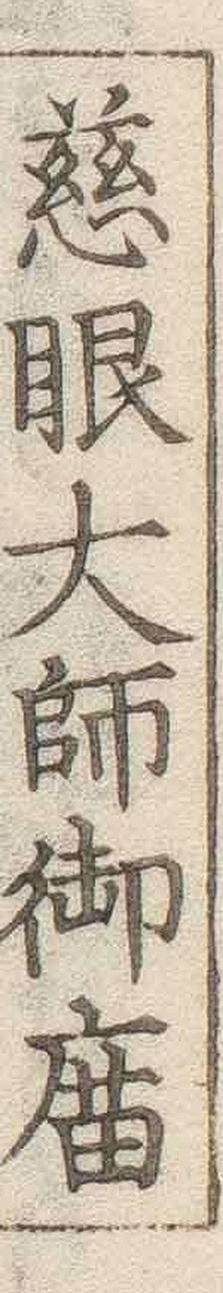慈眼大師御庿
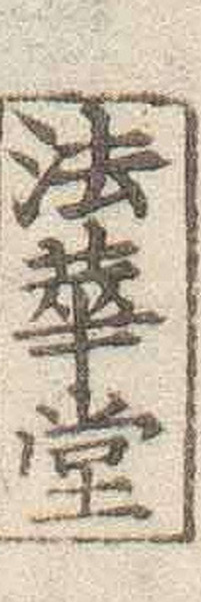法華堂
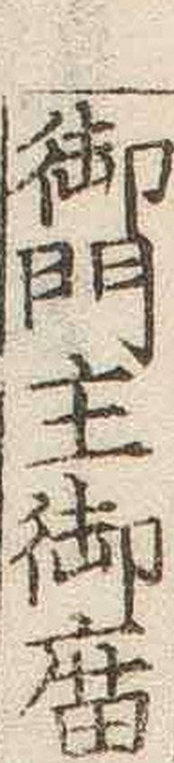御門主御庿
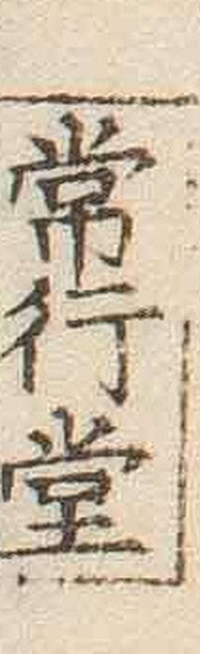常行堂

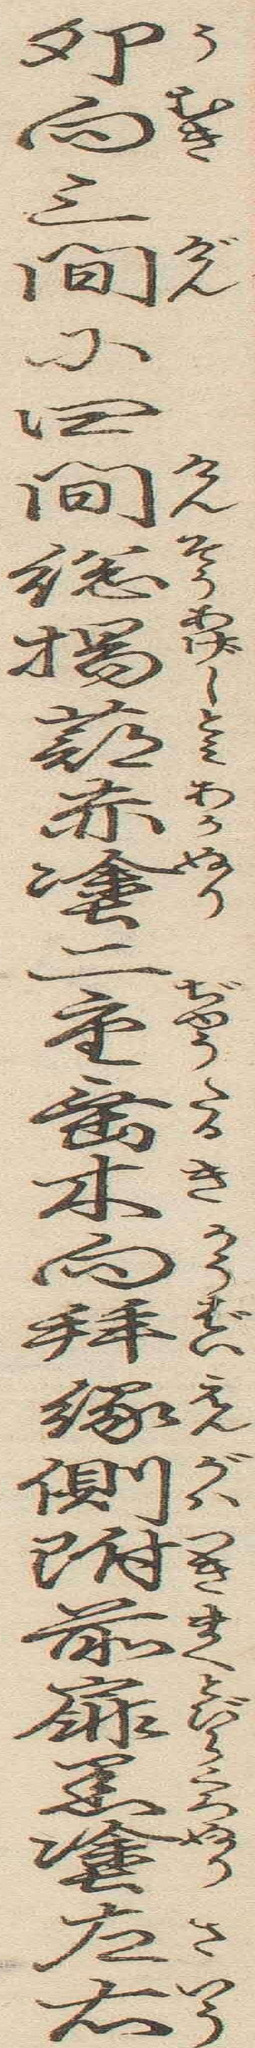卯向三間に四間総揚蔀赤塗二重垂木向拜縁側附前扉黒塗左右
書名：日光山志
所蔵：東京学芸大学附属図書館 国文学研究資料館
